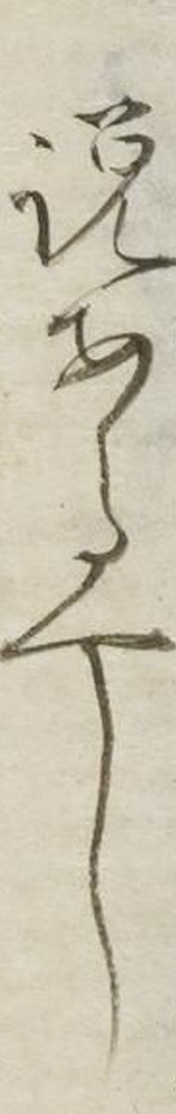説あるへし
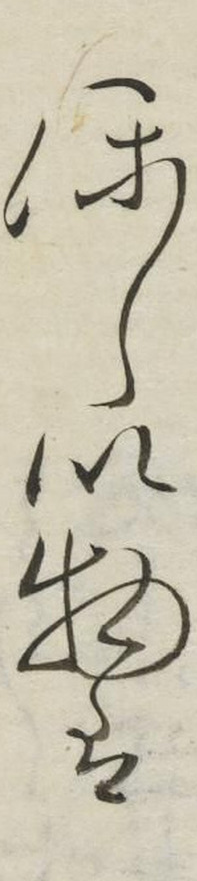ほしい物は
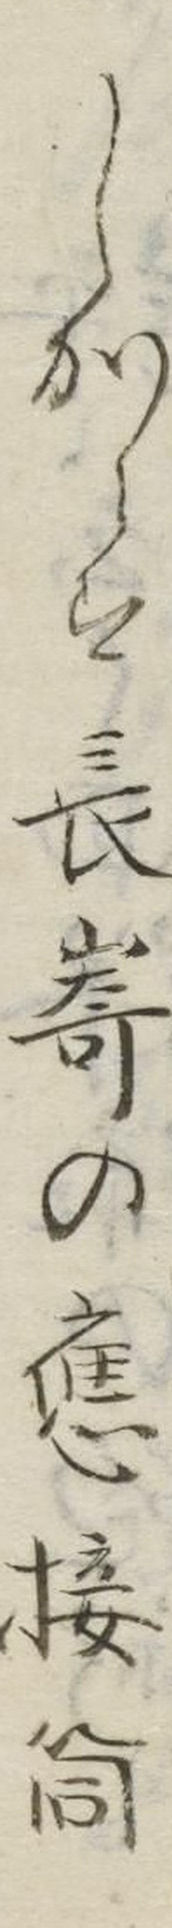しからす長嵜の応接筒
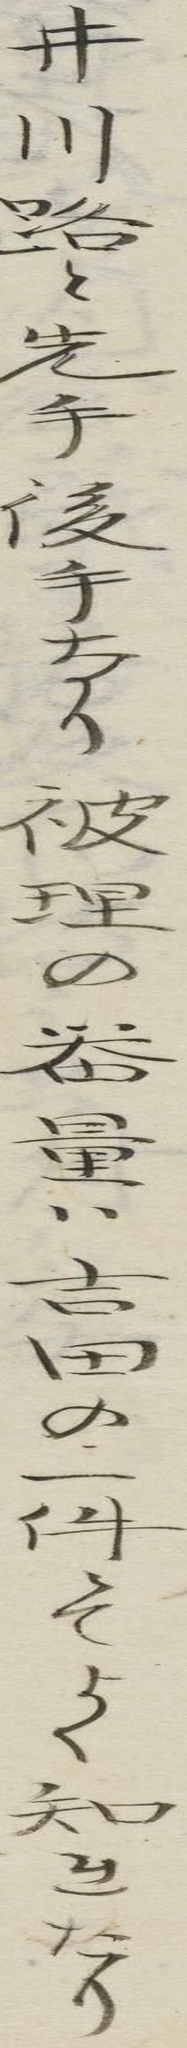井川路と先手後手なり被里の器量ハ吉田の一件ニてよく知れたり
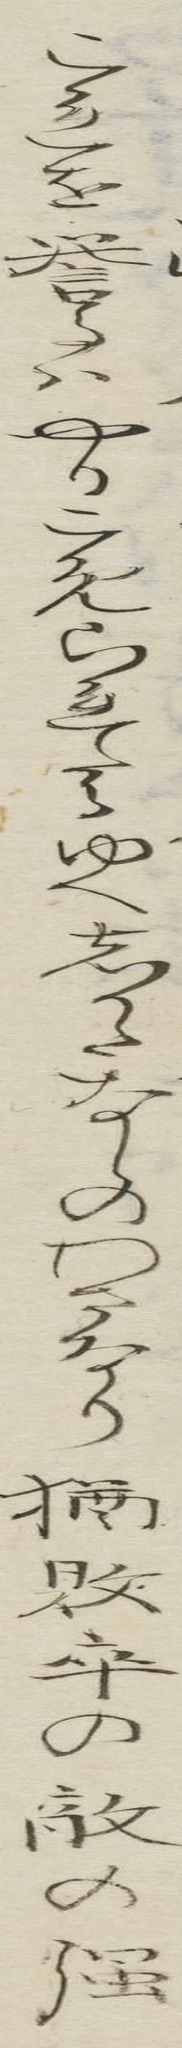これを誉るハやりこめられたるゆへしかたなしのわさなり猶敗卒の敵の強
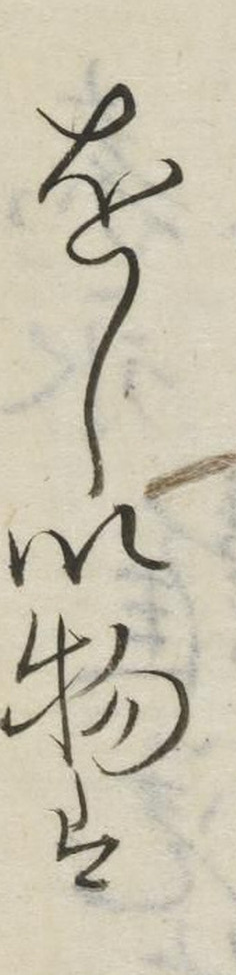をしい物は
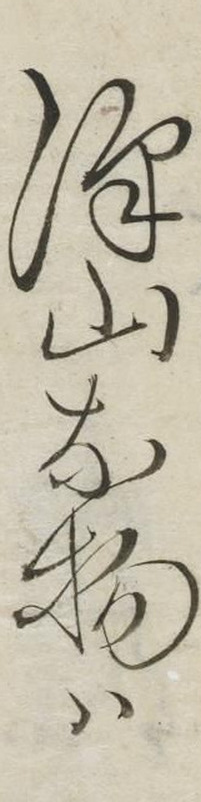沢山な物ハ
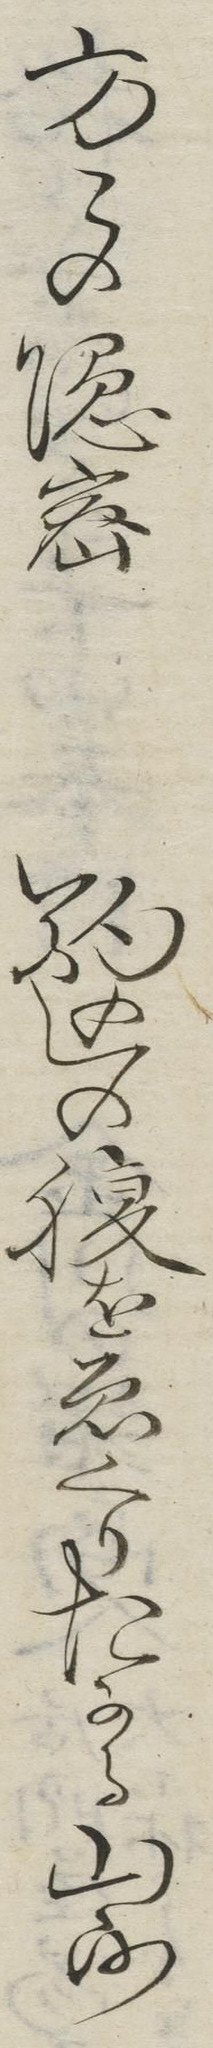方〻の隠密駒込の腹をゑくりたかる山師
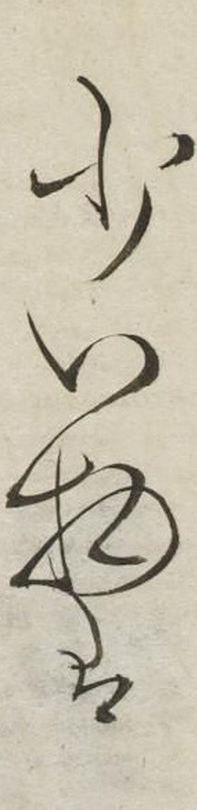少い物は
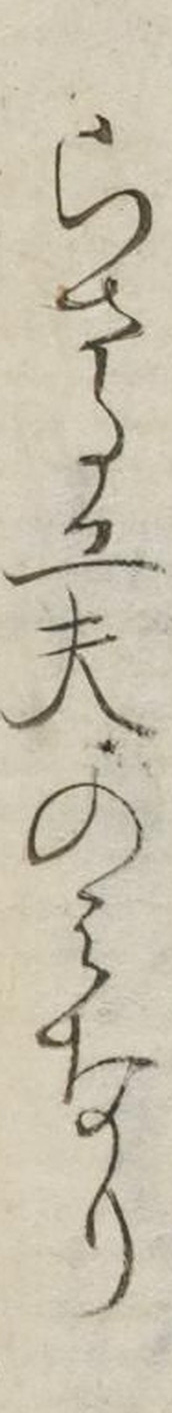らさる工夫のミなり方
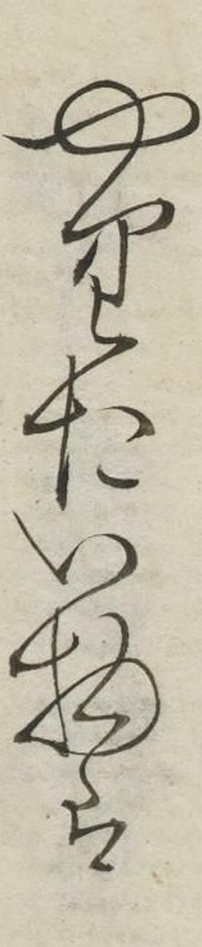やりたい物は
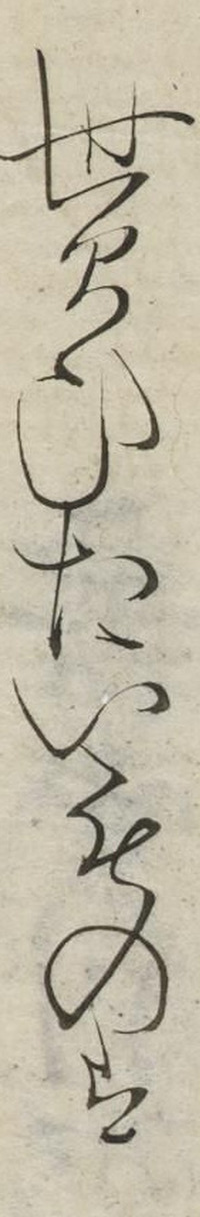貰ひたいものは

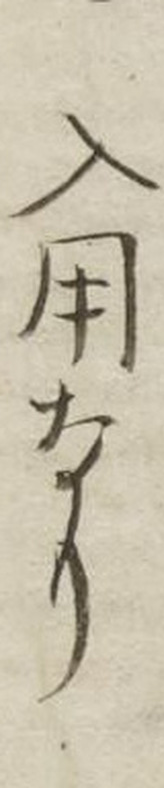入用なり
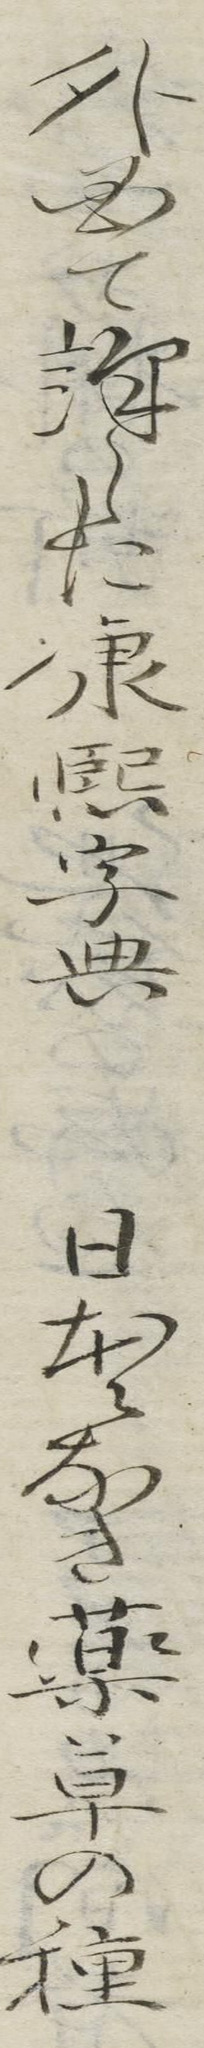外国て訳した康煕字典日本ニなき薬草の種
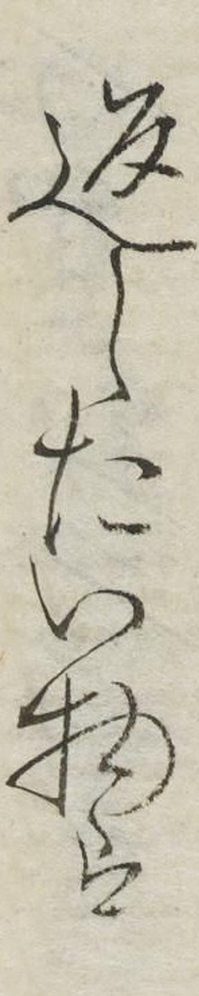返したい物は
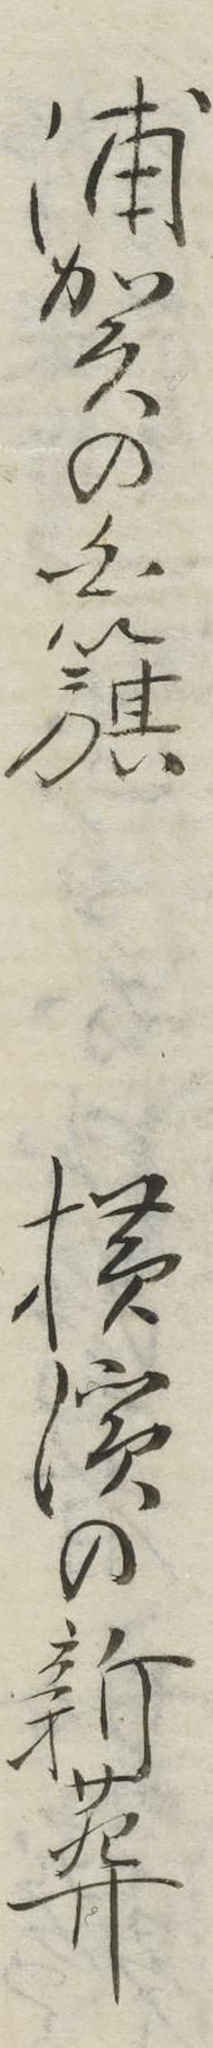浦賀の白旗横濱の新葬
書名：大地震實録
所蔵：東京大学地震研究所図書室 Earthquake Research Institute Library, The University of Tokyo, JAPAN
